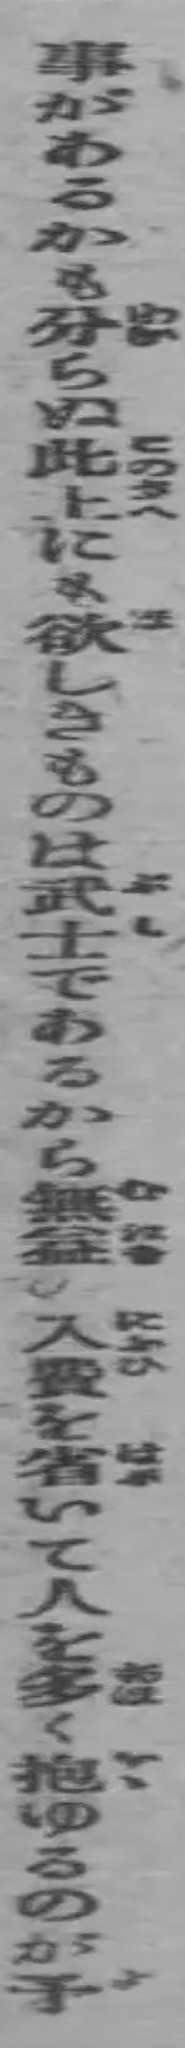事があるかも分らぬ此上にも欲しきものは武士であるから無益の入費を省いて人を多く抱ゆるのが予

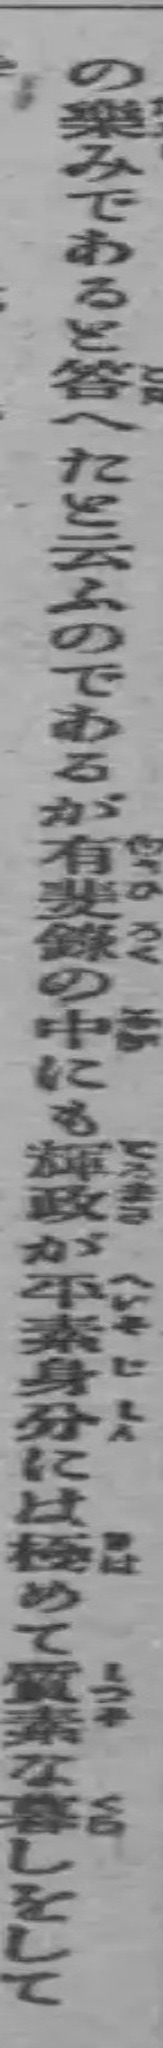の楽みであると答へたと云ふのであるが有斐録の中にも輝政が平素身分には極めて質素な暮しをして
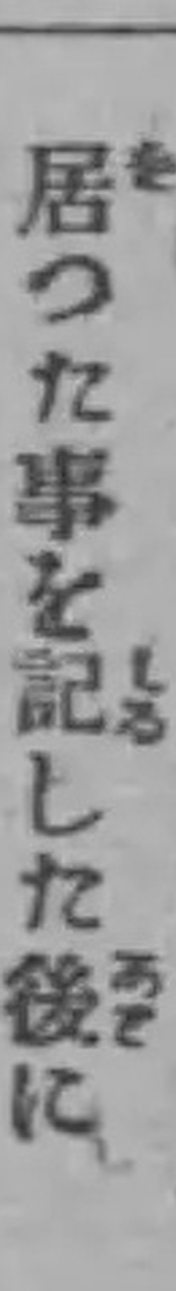居つた事を記した後に
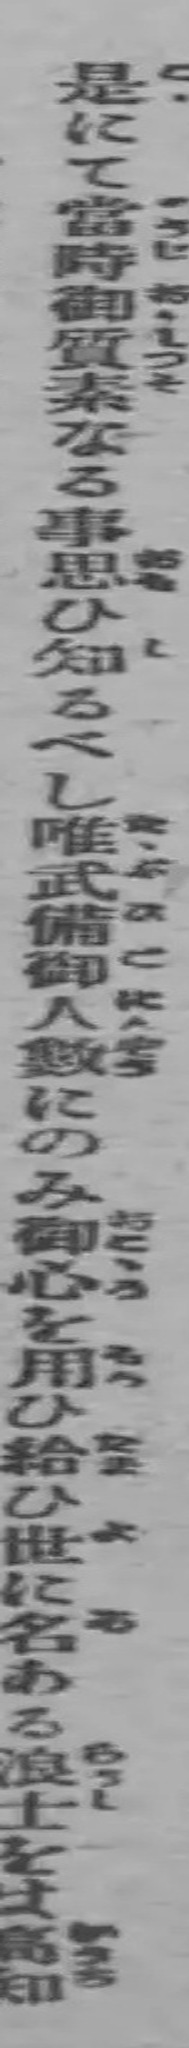是にて当時御質素なる事思ひ知るべし唯武備御人数にのみ御心を用ひ給ひ世に名ある浪士をは高知
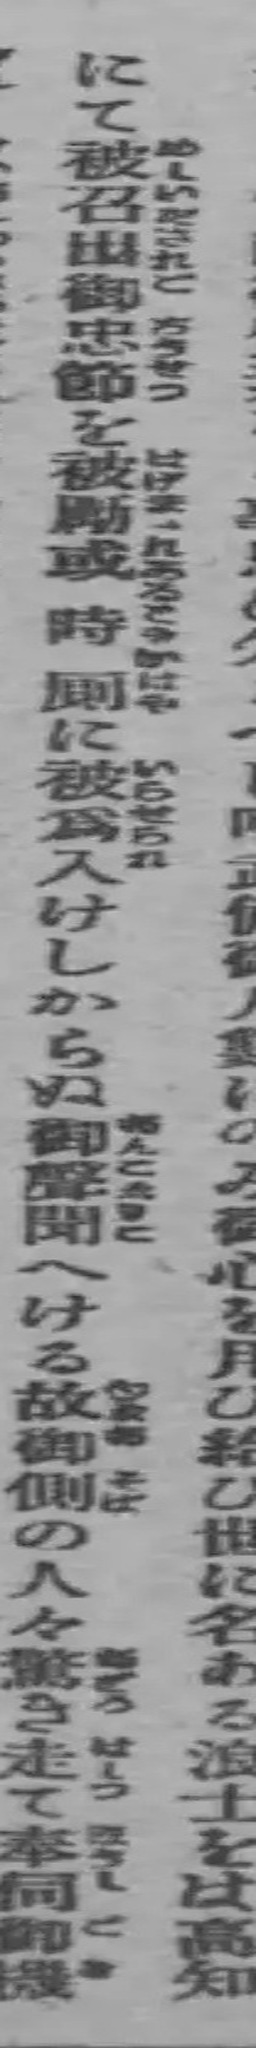にて被召出御忠節を被励或時厠に被為入けしからぬ御声聞へける故御側の人々驚き走て奉伺御機
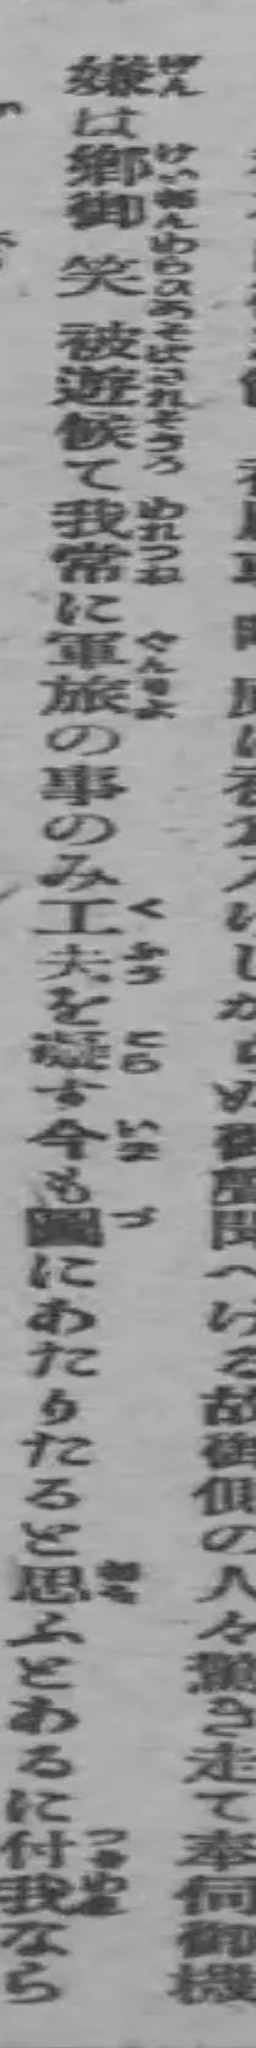嫌は郷御笑被遊候て我常に軍旅の事のみ工夫を凝す今も図にあたりたると思ふとあるに付我なら
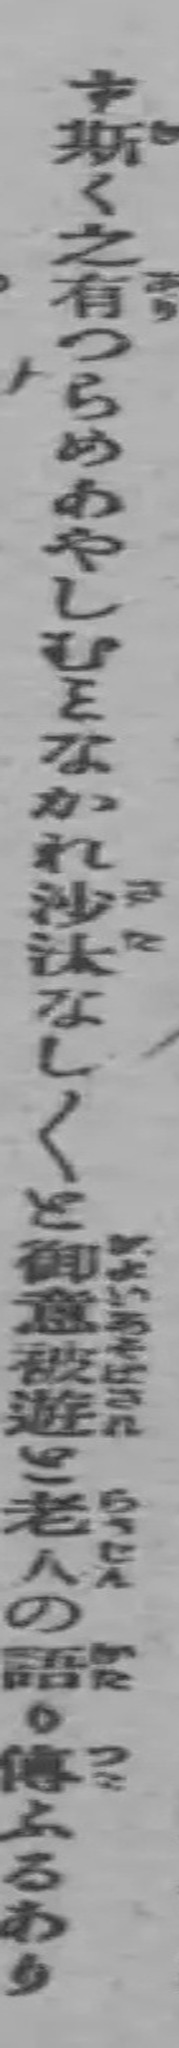ず斯く之有つらめあやしむことなかれ沙汰なし〳〵と御意被遊と老人の語り伝ふるあり
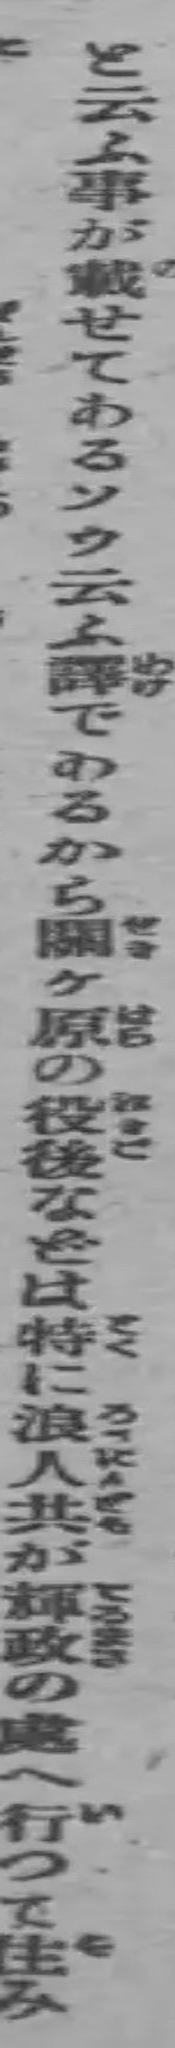と云ふ事が載せてあるソウ云ふ訳であるから関ヶ原の役後などは特に浪人共が輝政の処へ行つて住み
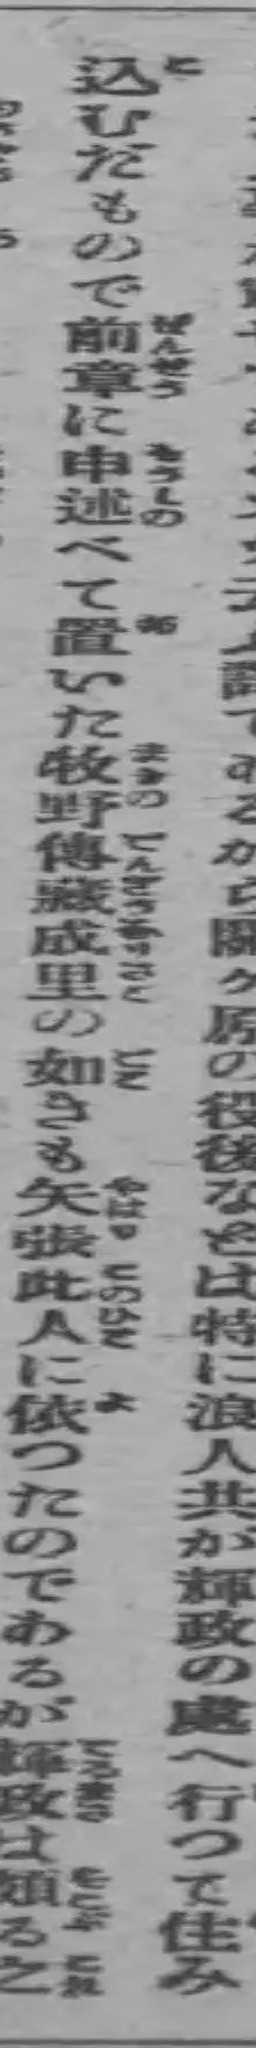込むだもので前章に申述べて置いた牧野傳蔵成里の如きも矢張此人に依つたのであるが輝政は頗る之
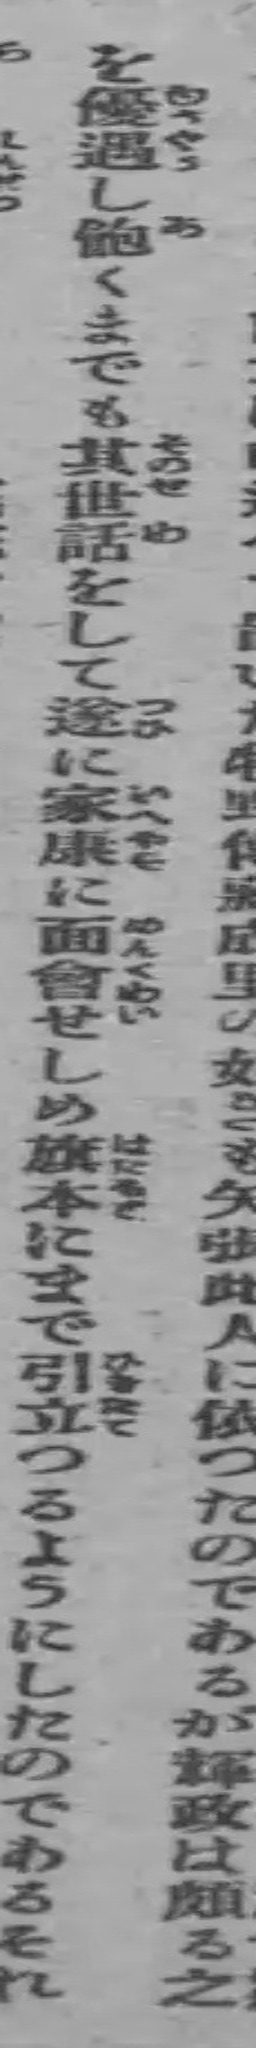を優遇し飽くまでも其世話をして遂に家康に面会せしめ旗本にまで引立つるようにしたのであるそれ
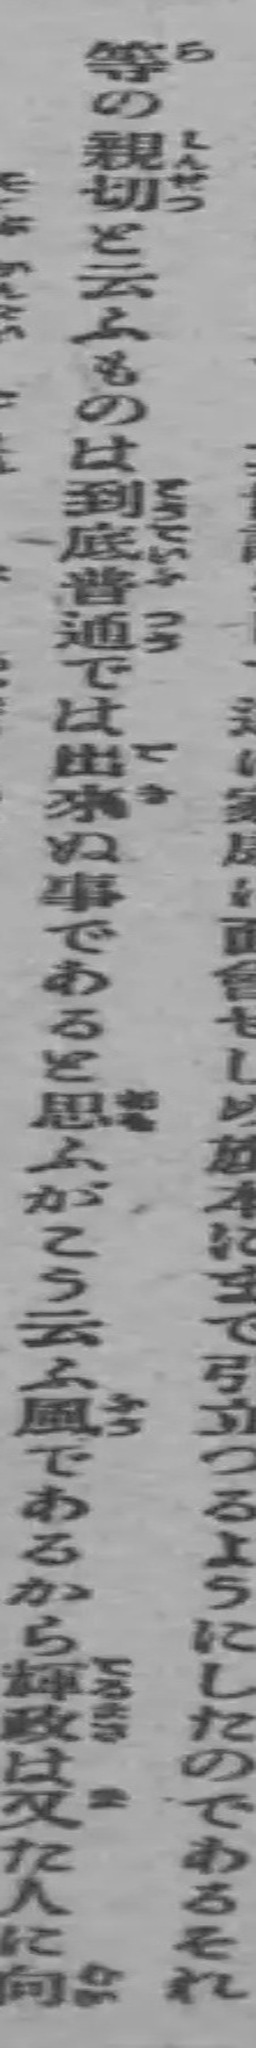等の親切と云ふものは到底普通では出来ぬ事であると思ふがこう云ふ風であるから輝政は又た人に向
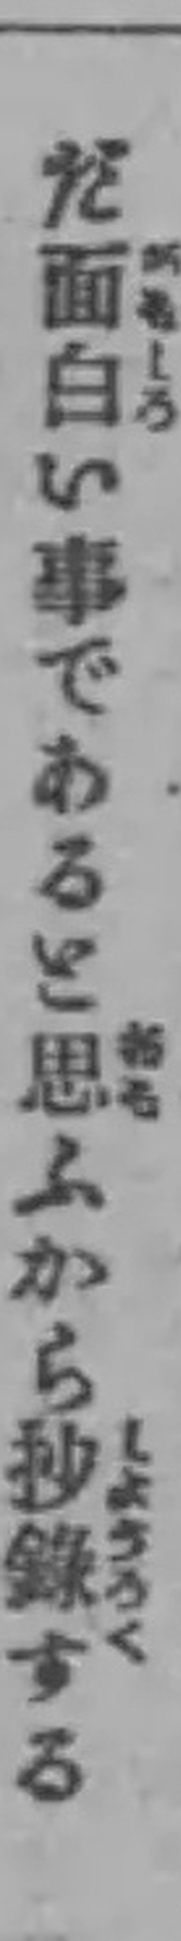だ面白い事であると思ふから抄録する
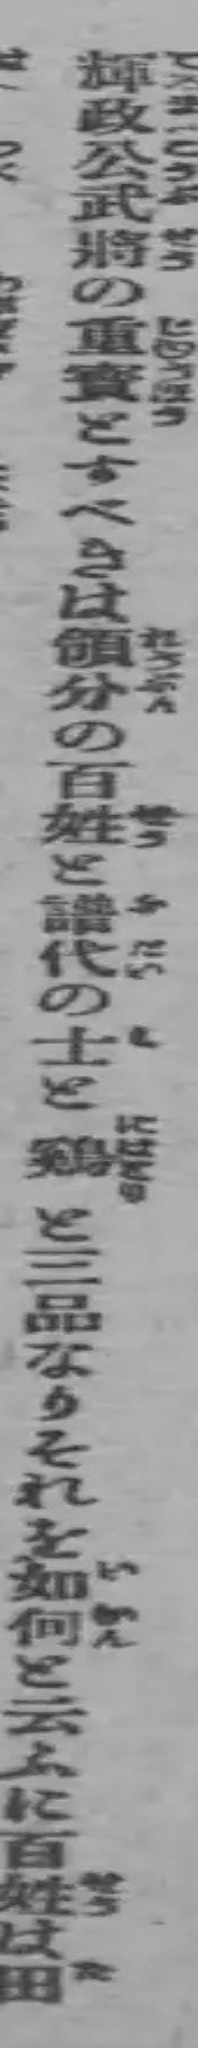輝政公武将の重宝とすべきは領分の百姓と譜代の士と鶏と三品なりそれを如何と云ふに百姓は田
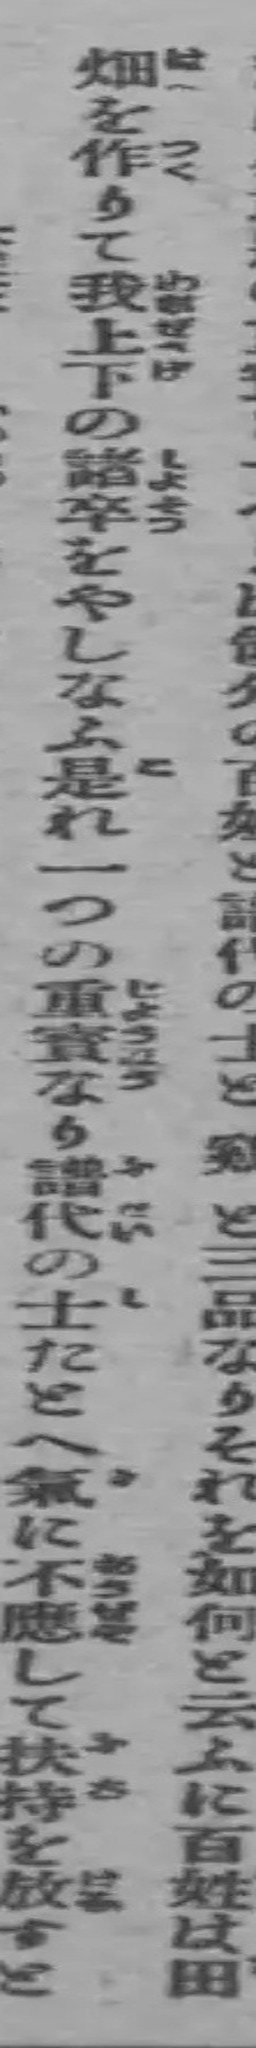畑を作りて我上下の諸卒をやしなふ是れ一つの重宝なり譜代の士たとへ気に不応して扶持を放すと
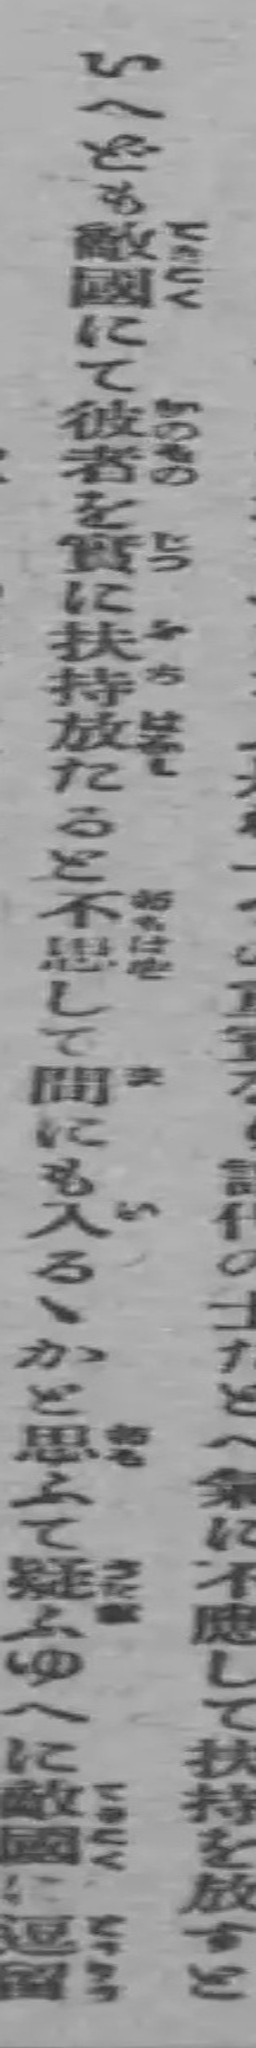いへども敵国にて彼者を実に扶持放たると不思して間にも入るゝかと思ふて疑ふゆへに敵国に逗留
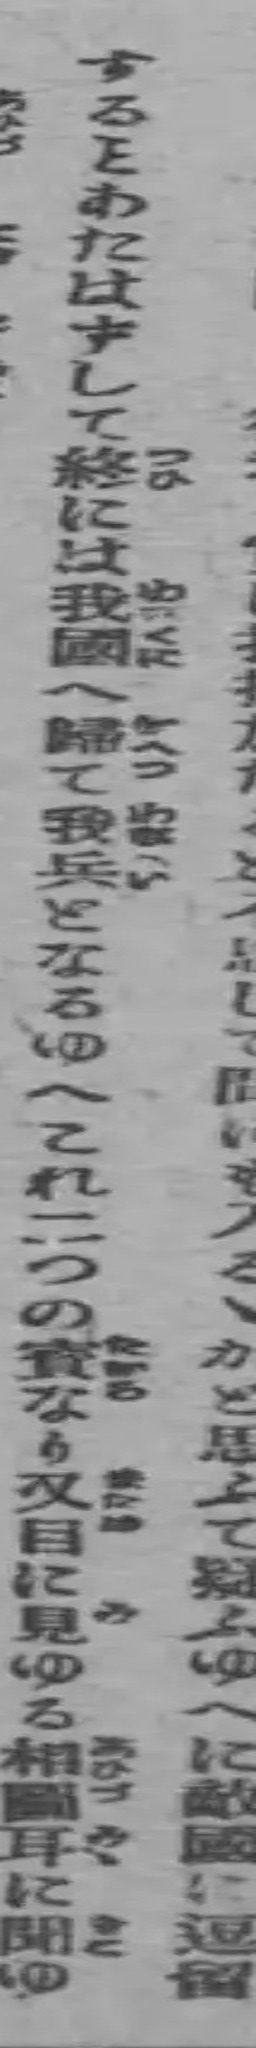することあたはずして終には我国へ帰て我兵となるゆへこれ二つの宝なり又目に見ゆる相図耳に聞ゆ
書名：豊橋市史談
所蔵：国立国会図書館 National Diet Library, JAPAN
